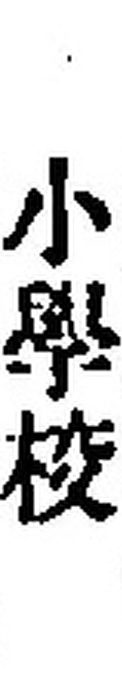小學校
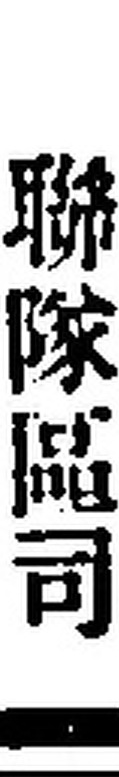聯隊區司
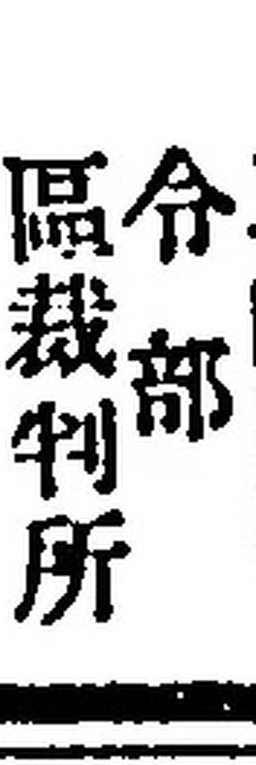區裁判所
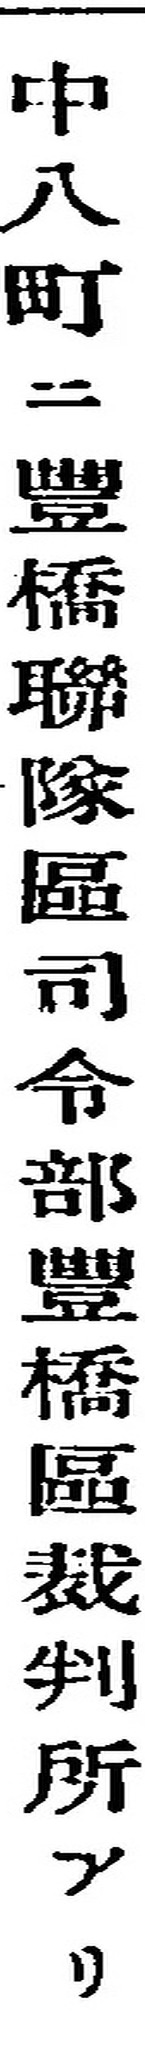中八町中八町ニ豐橋聯隊區司令部豐橋區裁判所アリ
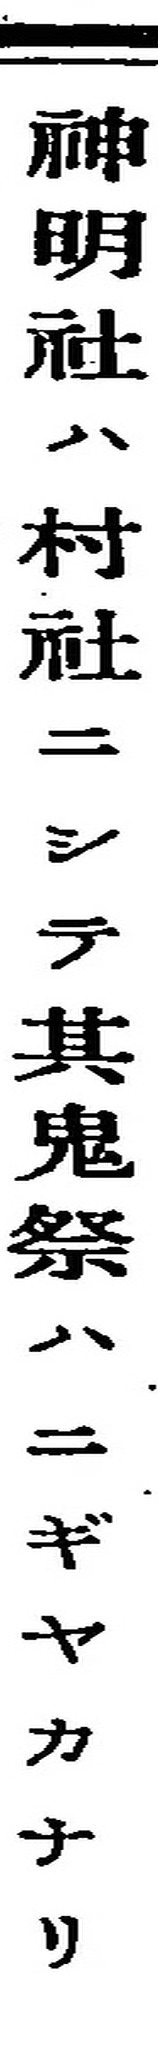神明社神明社ハ村社ニシテ其鬼祭ハニギヤカナリ
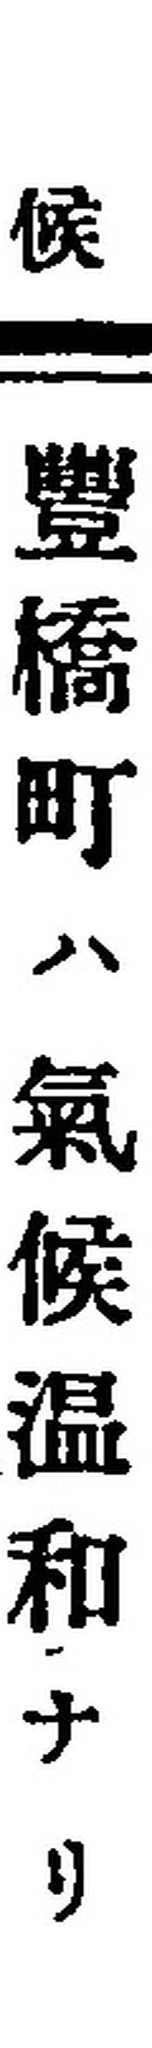氣候豐橋町ハ氣候温和ナリ
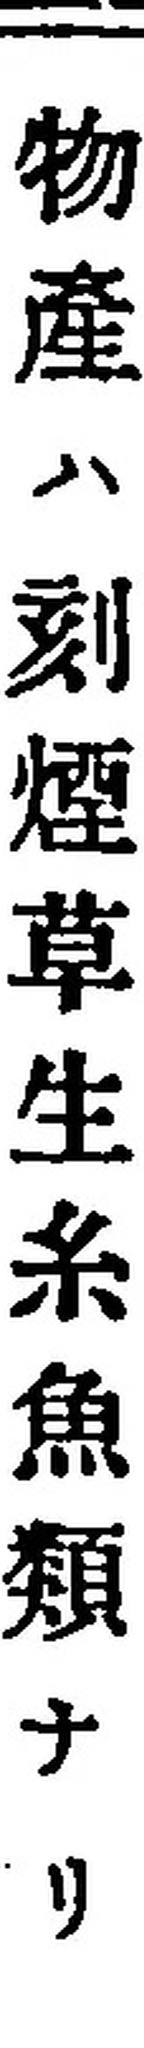物產物產ハ刻煙草生糸魚類ナリ
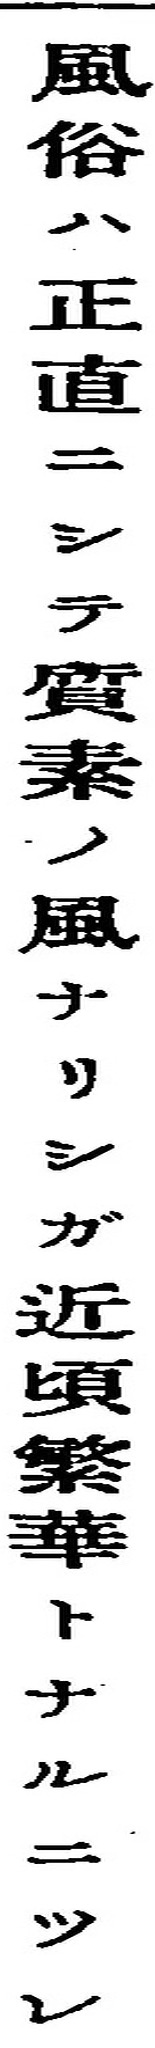風俗風俗ハ正直ニシテ質素ノ風ナリシガ近頃繁華トナルニツレ
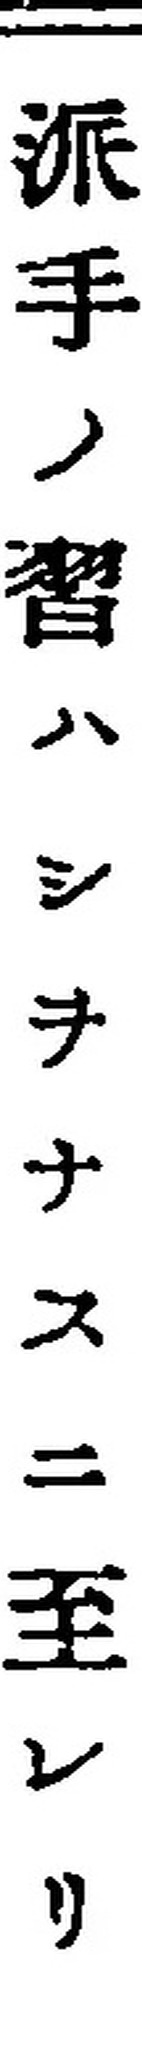派手ノ習ハシヲナスニ至レリ
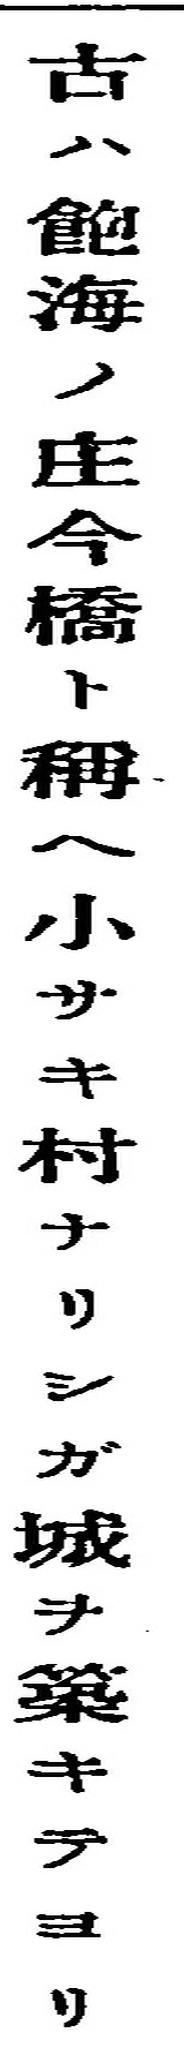沿革古ハ飽海ノ庄今橋ト稱ヘ小サキ村ナリシガ城ヲ築キテヨリ

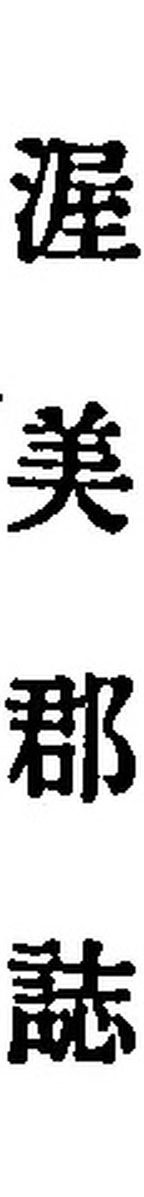渥美郡誌
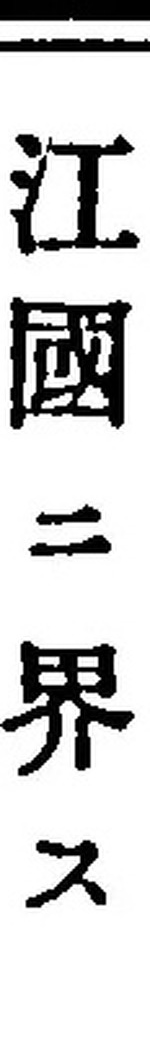江國ニ界ス
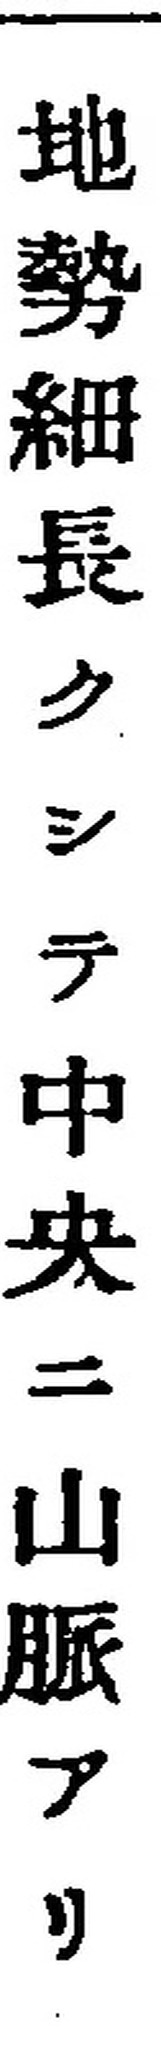地勢地勢細長クシテ中央ニ山脈アリ
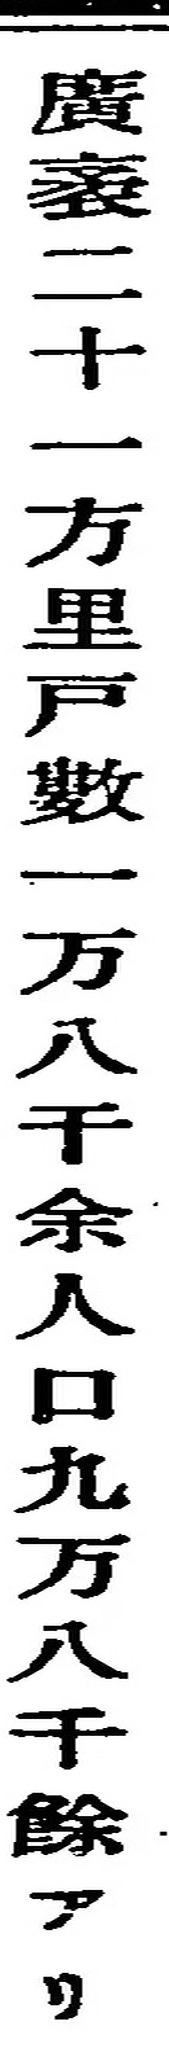廣袤廣袤二十一方里戸數一万八千余人口九万八千餘アリ
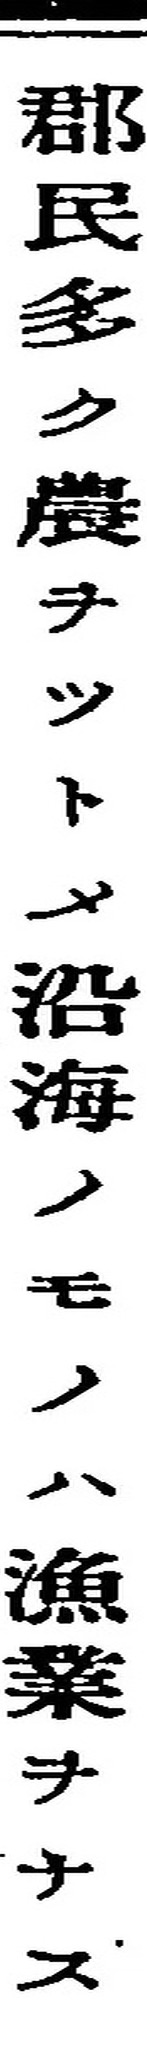生業郡民多ク農ヲツトメ沿海ノモノハ漁業ヲナス
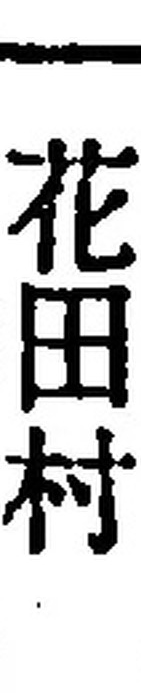植田村
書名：郷土誌
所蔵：国立国会図書館 National Diet Library, JAPAN
